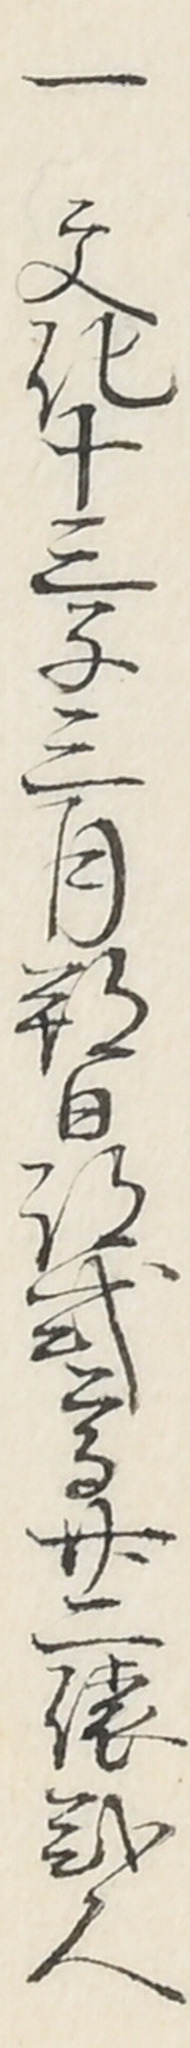一文化十三子三月朔日跡式高廿二俵弐人
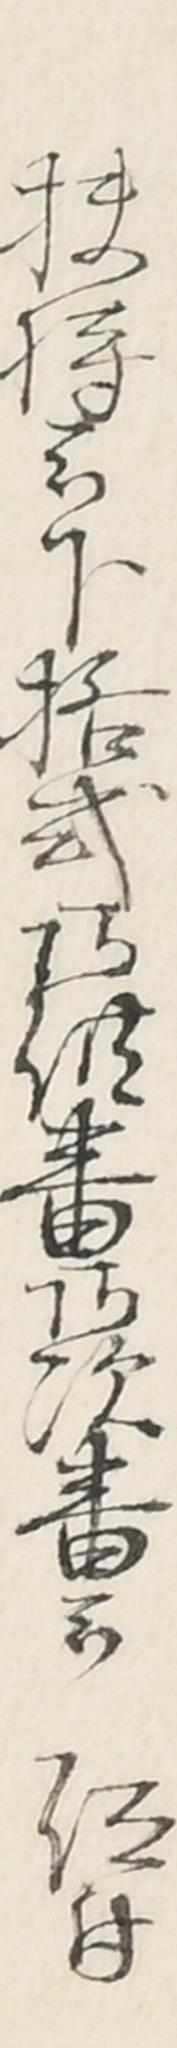扶持被下格式御供番御次番被仰付
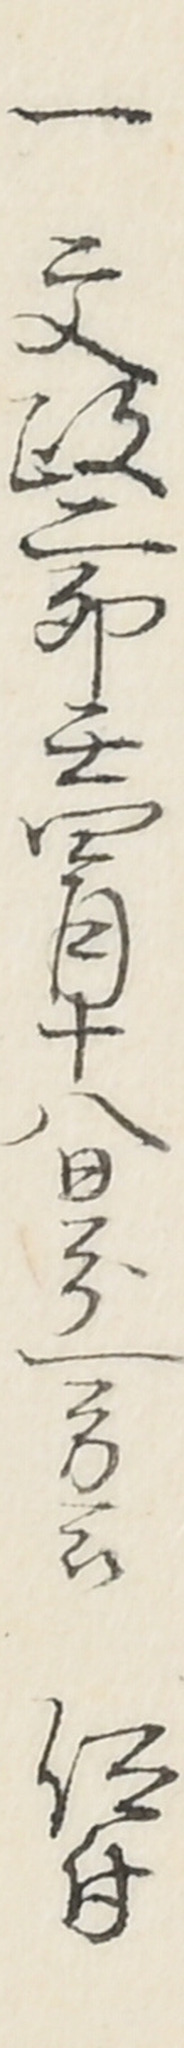一文政二卯閏四月十八日分一方被仰付
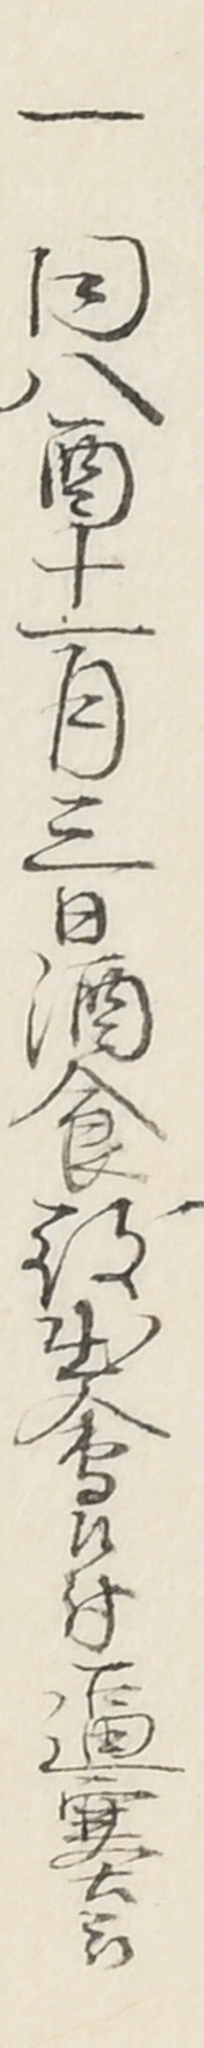一同八酉十一月三日酒食致出会候付逼塞被
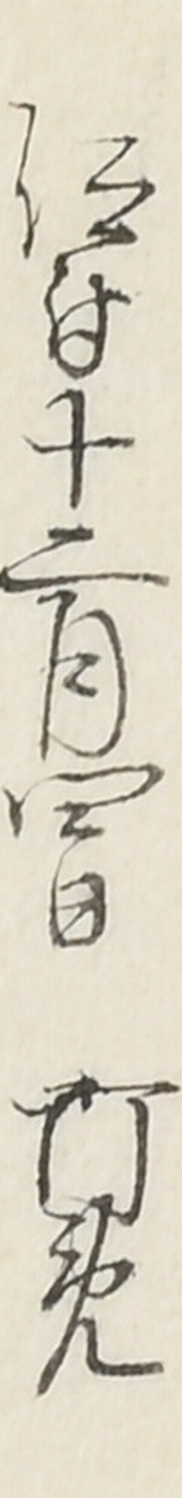仰付十二月四日御免
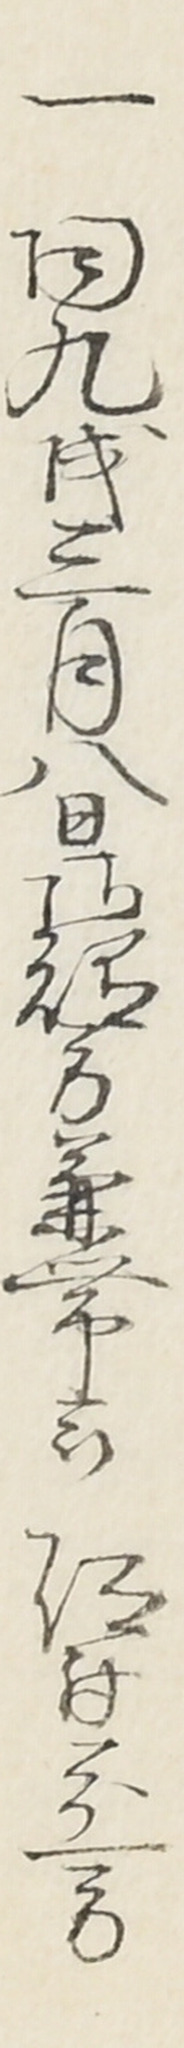一同九戊三月八日御賄方兼帯被仰付分一方
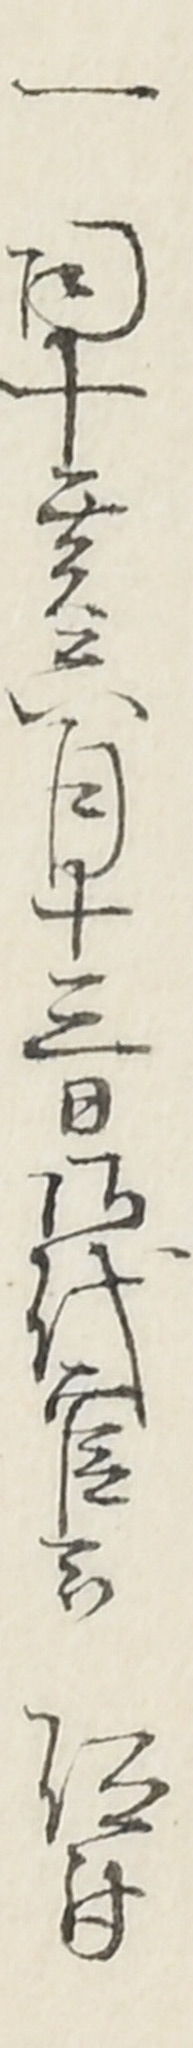一同十亥六月十三日御代官被仰付
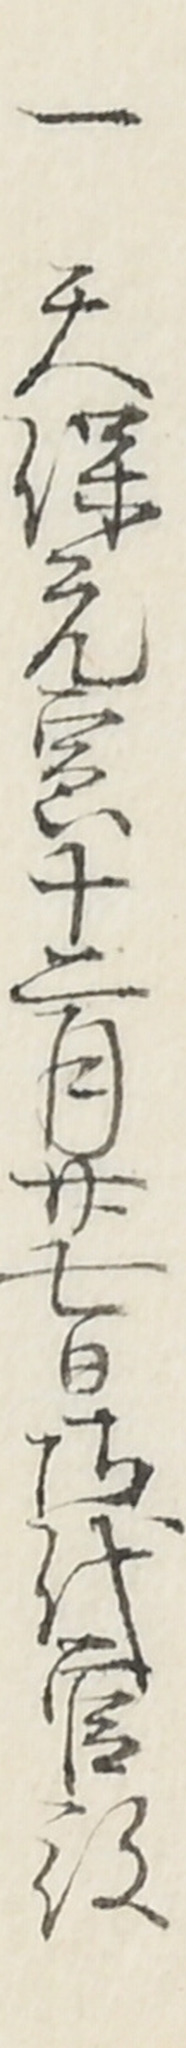天保元寅十二月廿七日御代官役
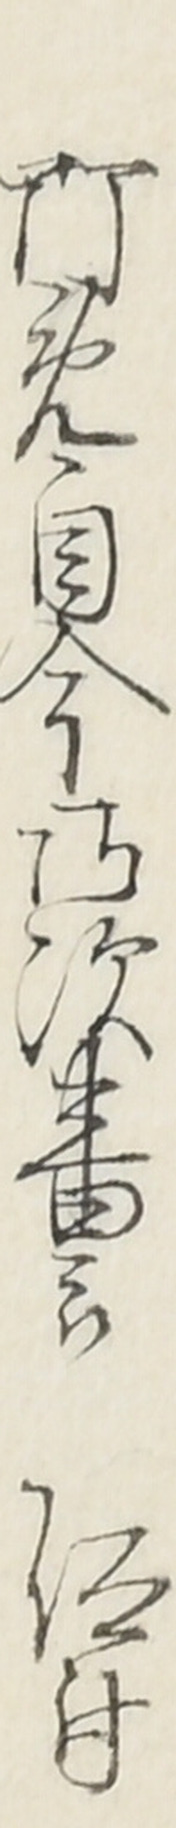御免自今御次番被仰付
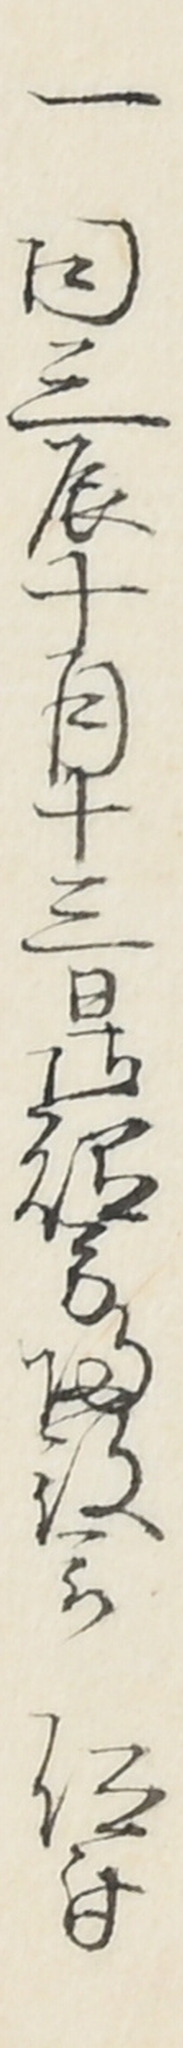一同三月辰十月十三日御賄方帰役被仰付
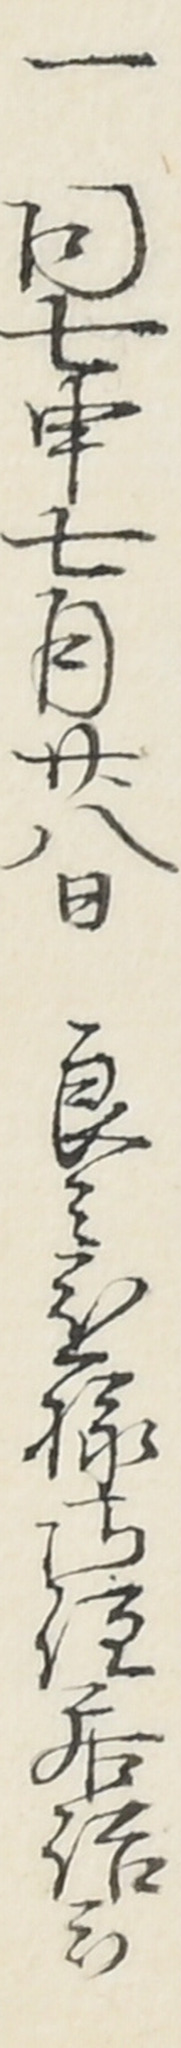一同七申七月廿八日良之進様御住居詰被
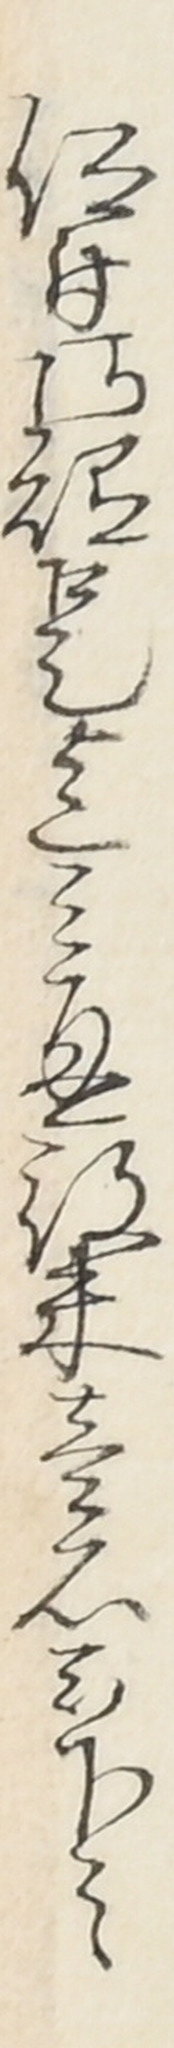仰付御賄是迄之通役米壱石被下之

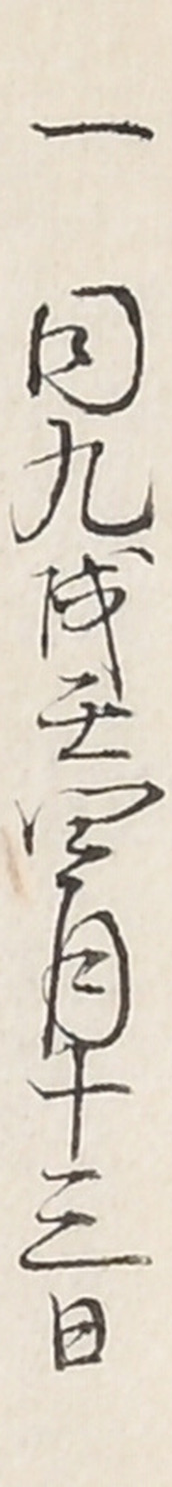一同九戌閏四月十三日
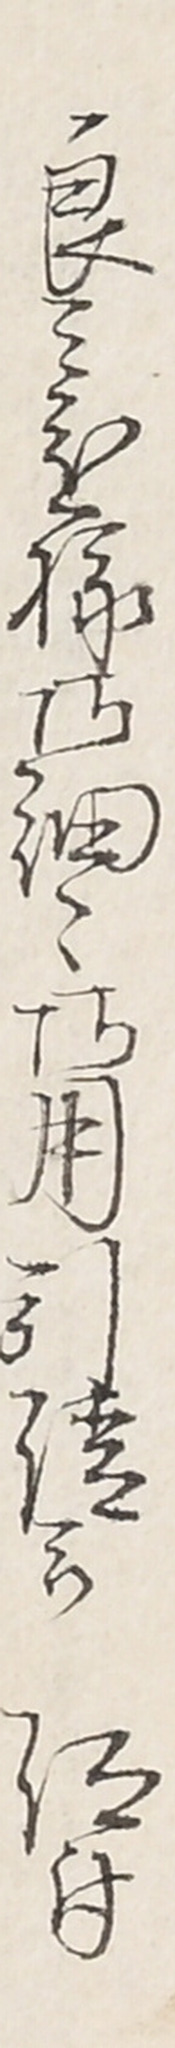良之進様御細々御用引請被仰付
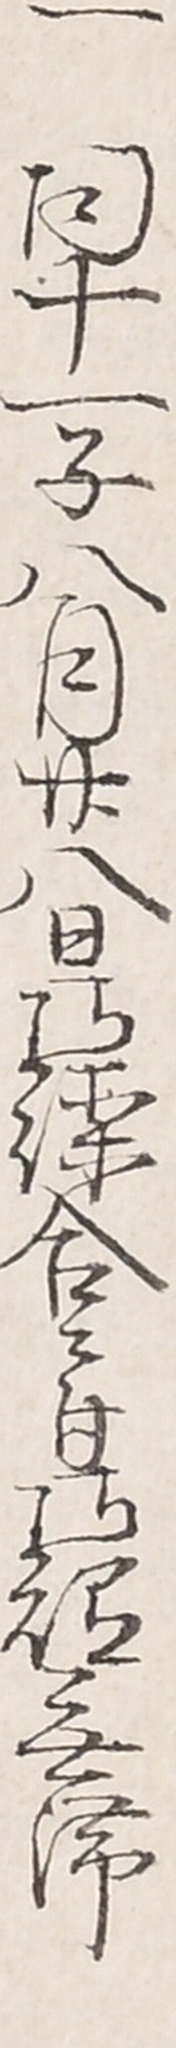一同十一子八月廿八日御繰合ニ付御賄無滞
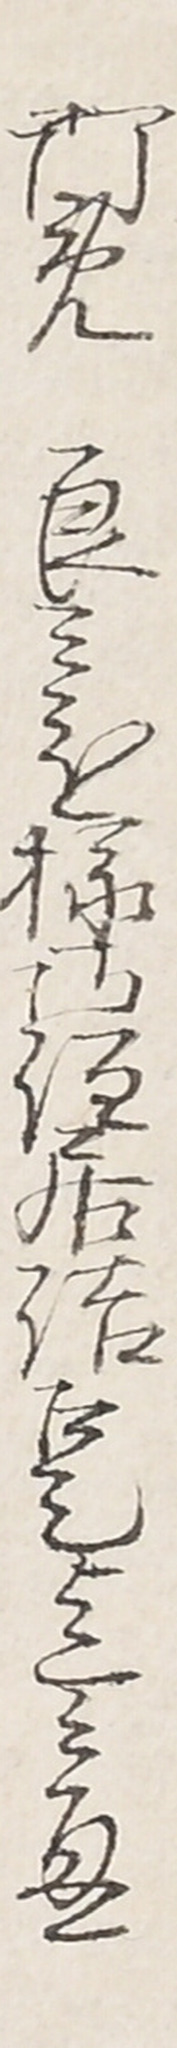御免良之進様御住居詰是迄之通
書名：無足諸士勤仕録（四）
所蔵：伊那市立高遠町図書館・合同会社AMANE
